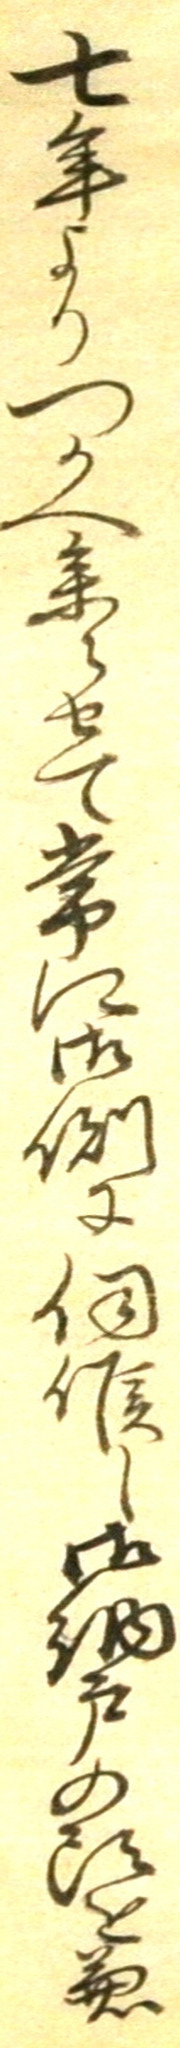七年よりつかへ参らせて常に御側に伺候し御納戸の頭を兼
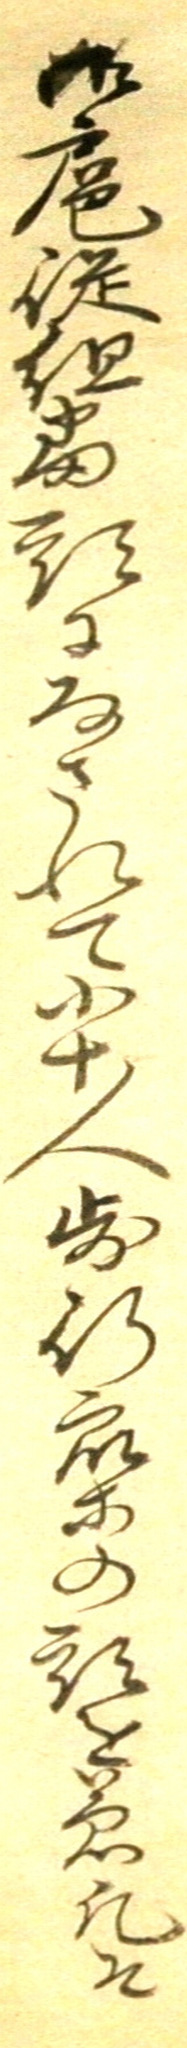御扈従組番頭になされて小十人歩行衆等の頭を兼凡そ
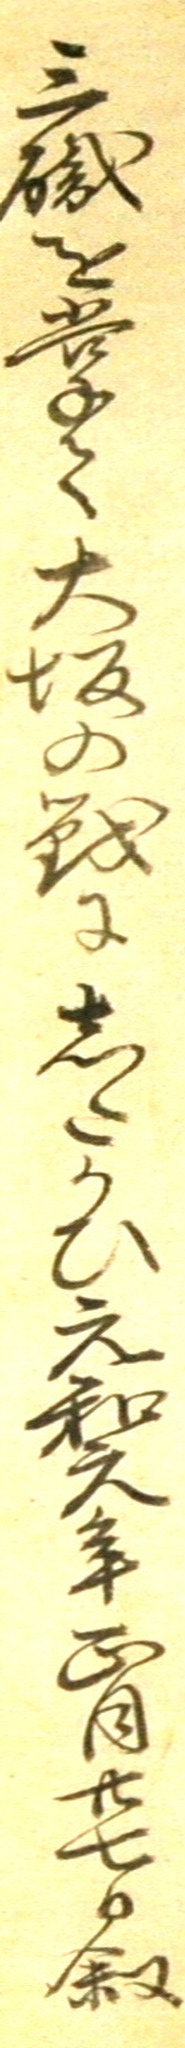三職を掌て大坂の戦にしたかひ元和元年正月廿七日叙
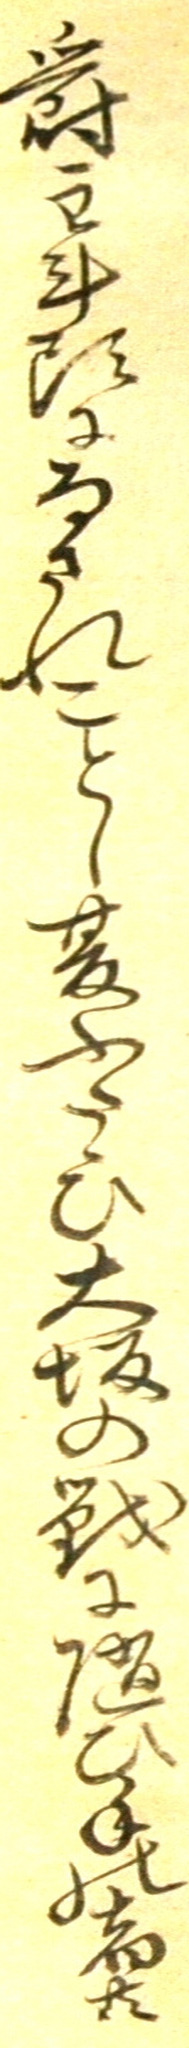爵主計頭になされことし夏ふたゝひ大坂の戦に随ひ手の物共

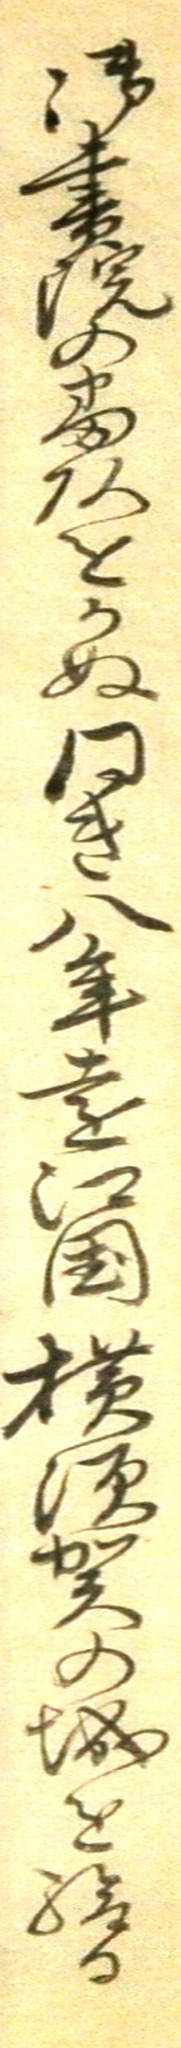御書院の番頭をかぬ同き八年遠江国横須賀の城を給る
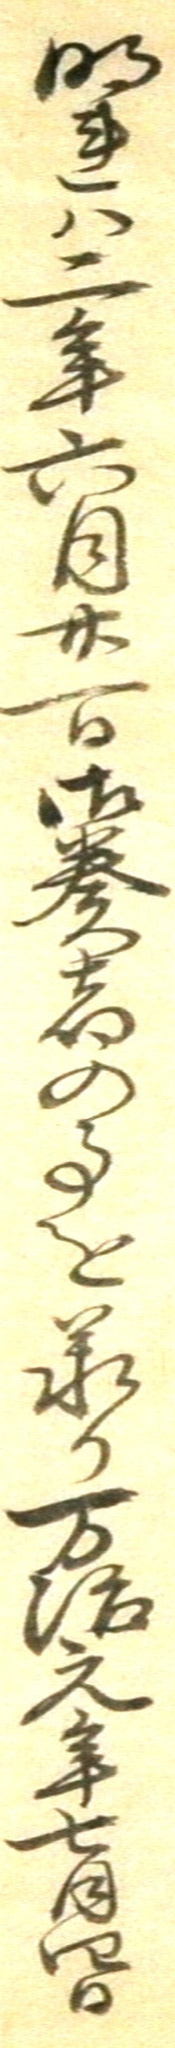明れは二年六月廿一日御奏者の事を承り万治元年七月四日
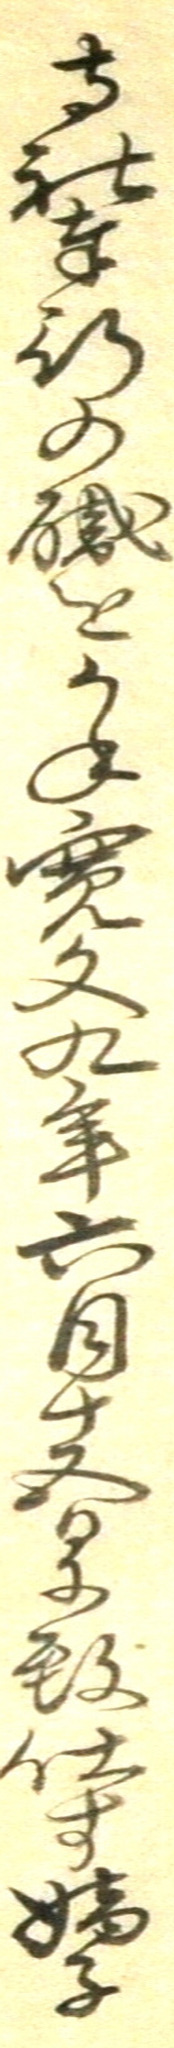寺社奉行の職をかね寛文九年六月十五日に致仕す嫡子
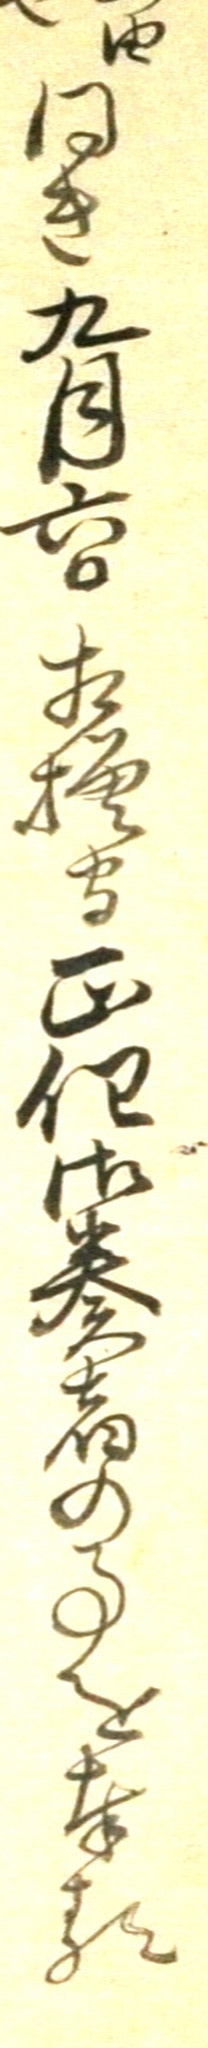の由也同き九月六日相模守正任御奏者の事を奉る
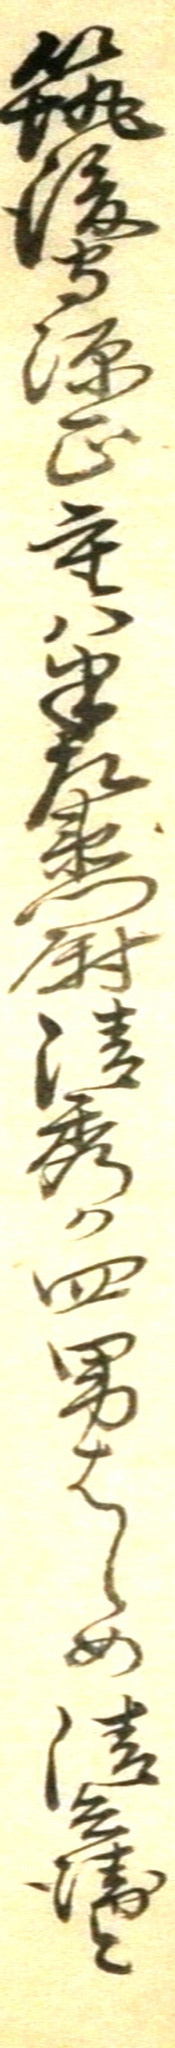筑後守源正重は半左衛門尉清秀か四男はしめ清兵衛と
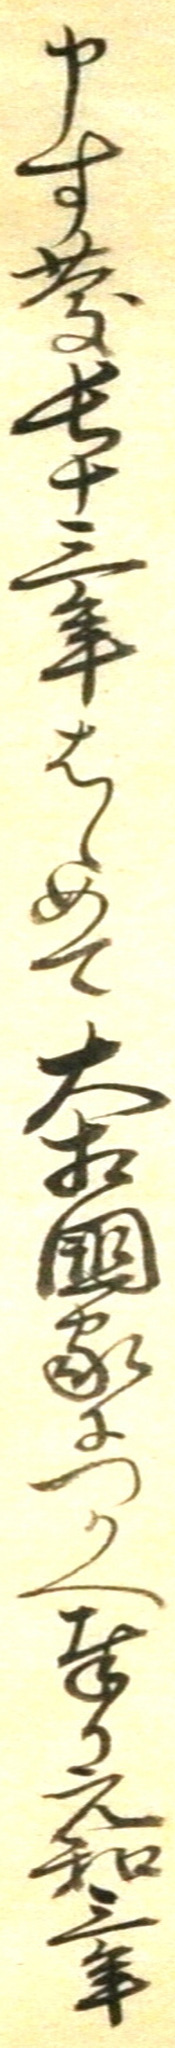申す慶長十三年はしめて大相国家につかへ奉り元和三年
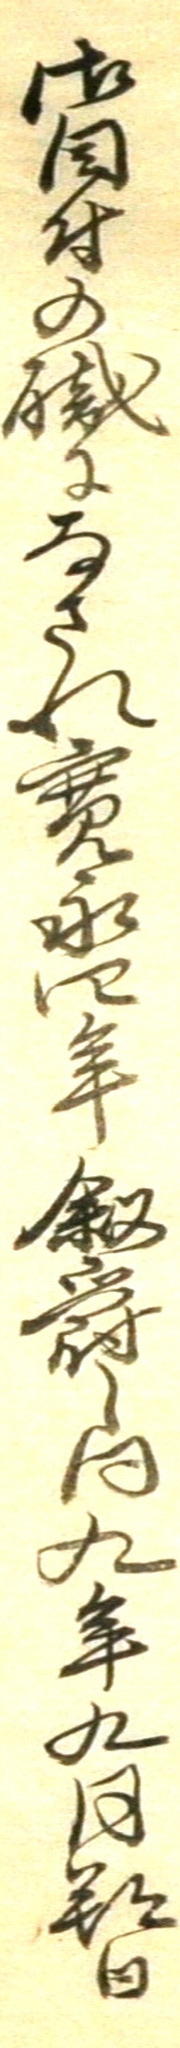御目付の職になされ寛永四年叙爵し同九年九月朔日
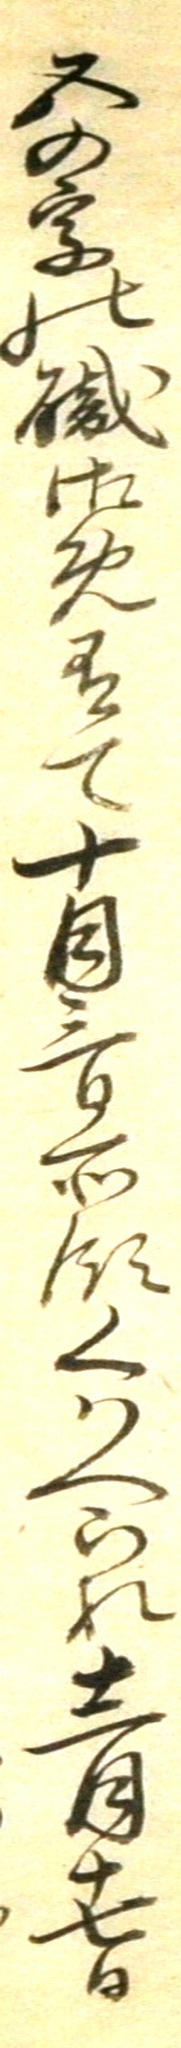五の字の職御免有て十月三日所領くはへられ十二月十七日
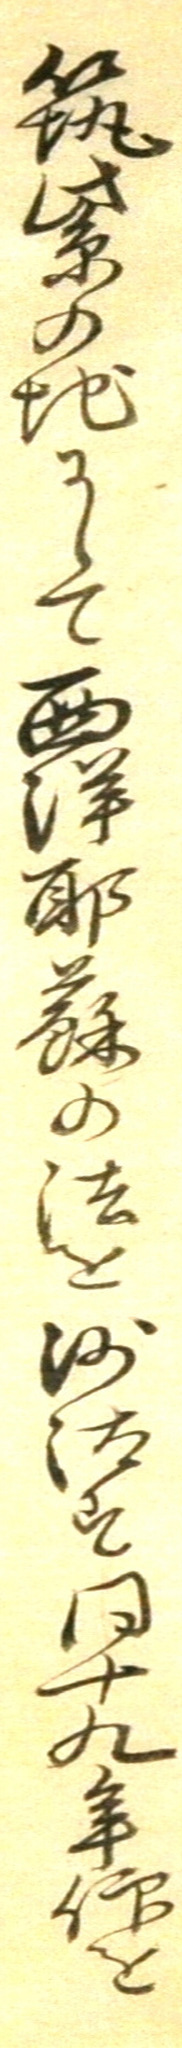筑紫の地にして西洋耶蘇の法を沙汰す同十九年仰を
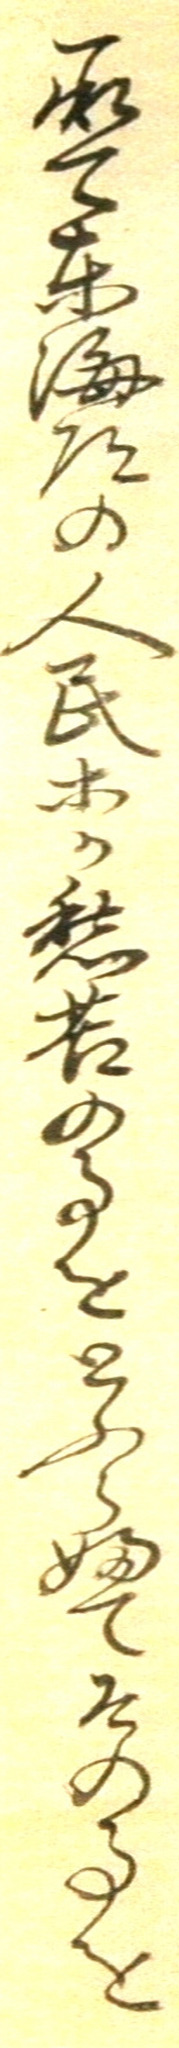承て東海道の人民等か愁苦の事をとふらふてその事を

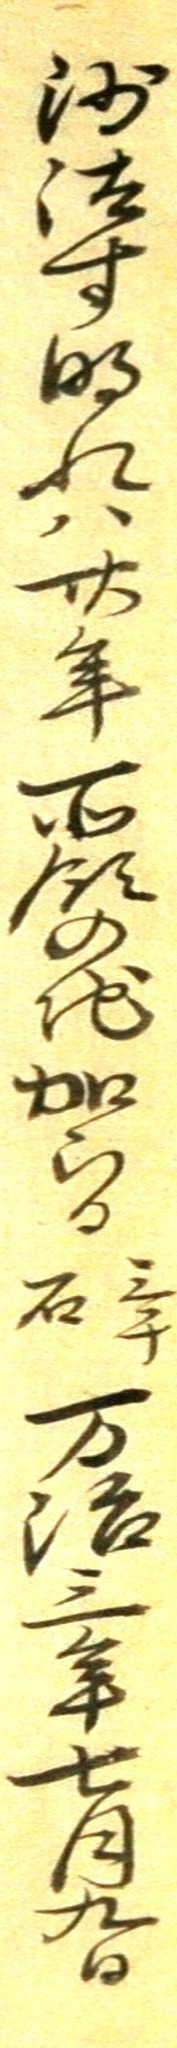沙汰す明れは廿年所領の地加らる三千石万治三年七月九日
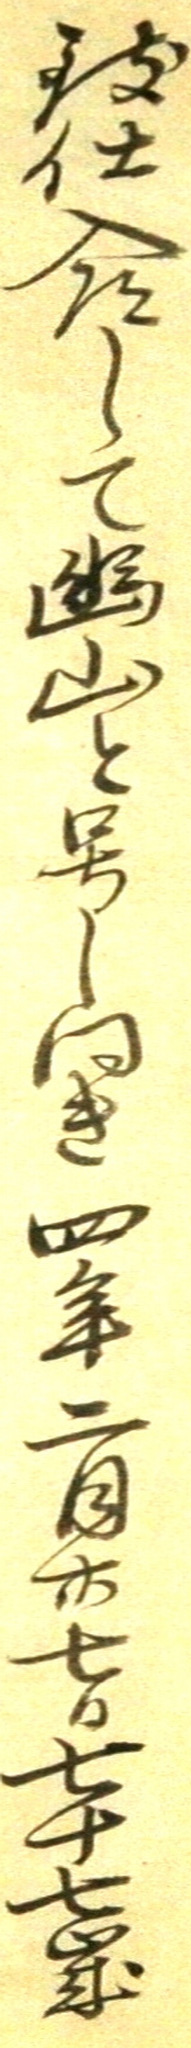致仕入道して幽山と号し同き四年二月廿七日七十七歳
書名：藩翰譜（五）
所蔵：伊那市立高遠町図書館・合同会社AMANE
